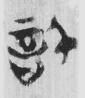信
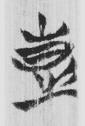彭
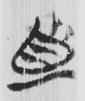且
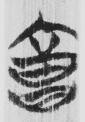會[合]
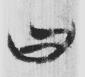曰
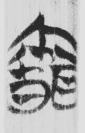{尒䎽}
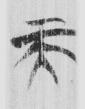天
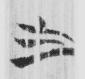之
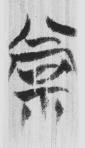常
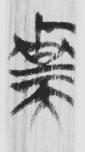{真天}（祗）
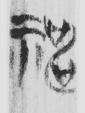神
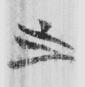之
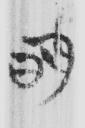明
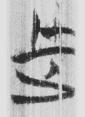上B
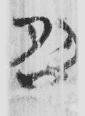卲
